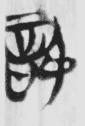{言身}
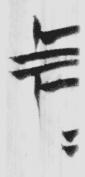上下=
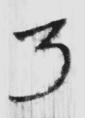乃
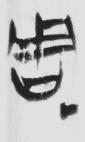周
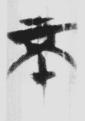不
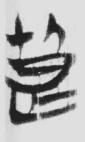良
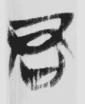君
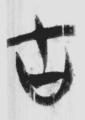古
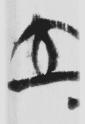立
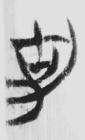{古力}
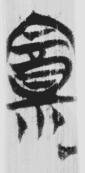福
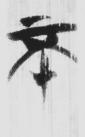不
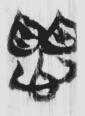{䀠心}
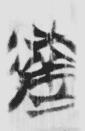{辶止㚔}
